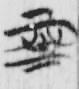亞
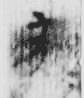夫
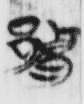○（宛）
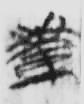𨍱（乘）
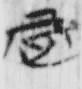○（返）
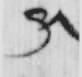孑
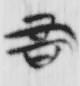言
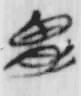{胃刀}（謂）
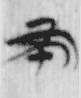不
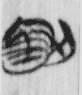割
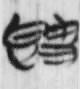既
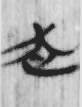走
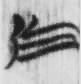於
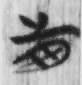前
